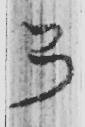乃
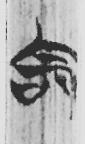命
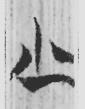少
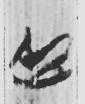臣
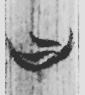曰
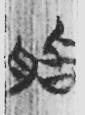脂
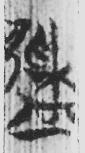{弓采皿}
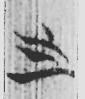之
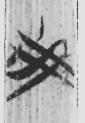我
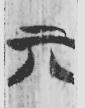亓
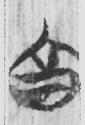亯
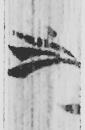之
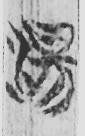湯
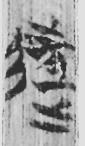{辶之𡈼}
